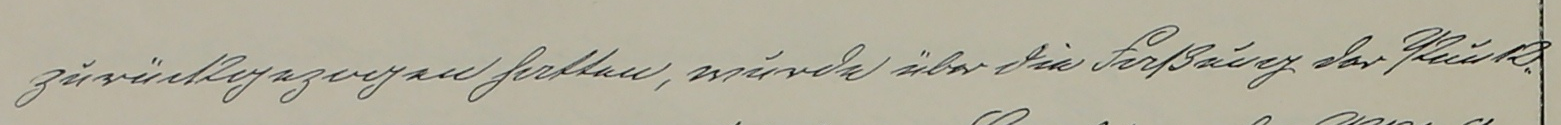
zurückgezogen hatten, wurde über die Faßung der Punk-
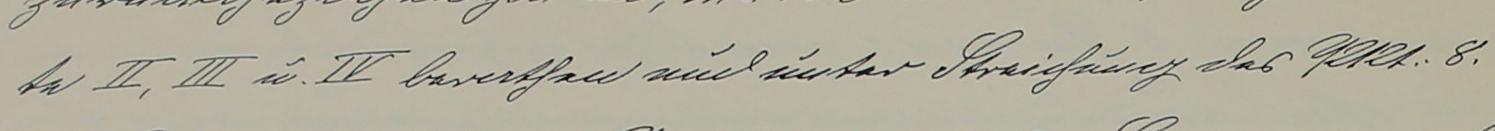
te II, III u. IV berathen und unter Streichung des Pkt. 8.
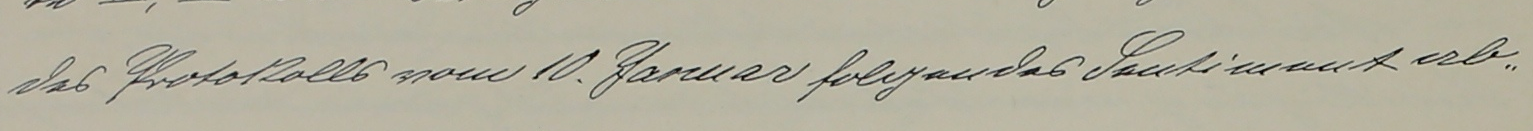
des Protokolls vom 10. Januar folgendes Sentiment ab-
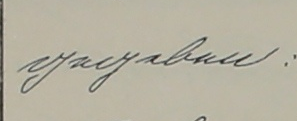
gegeben:
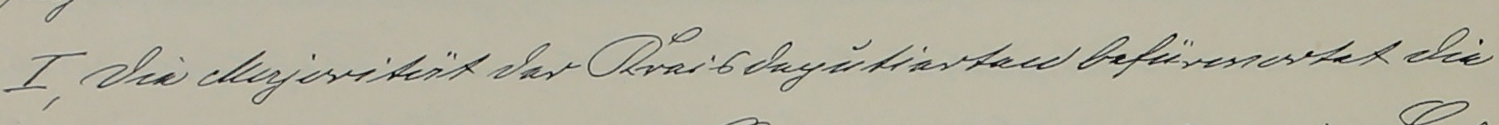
I. Die Majorität der Kreisdeputierten befürwortet die
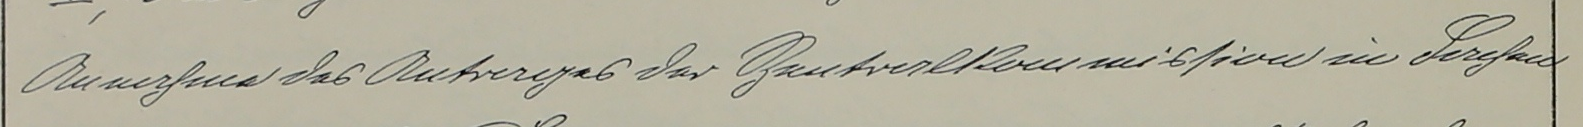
Annahme des Antrages der Zentralkommission in Sachen
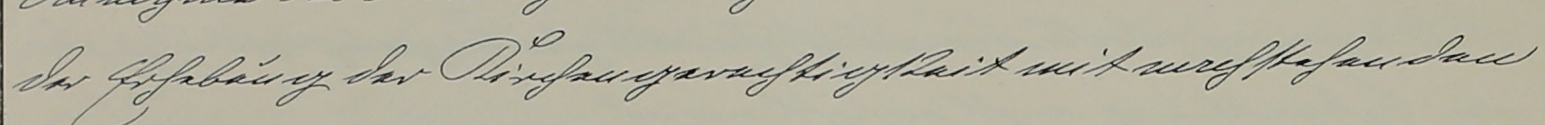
der Erhebung der Kirchengerechtigkeit mit nachstehenden
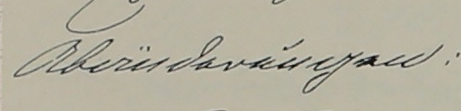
Abänderungen:
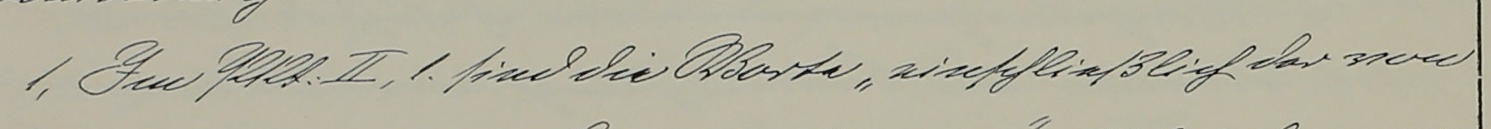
1. Im Pkt. II,1. sind die Worte „einschließlich der von
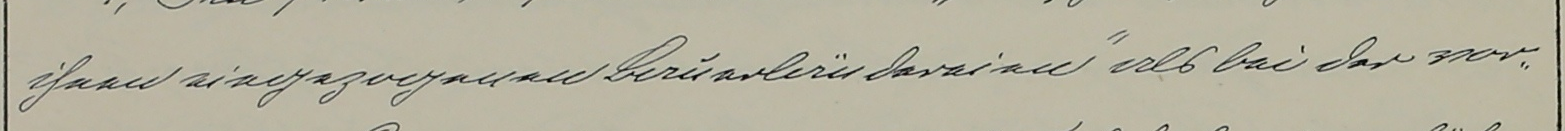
ihnen eingezogenen Bauerländereien“ als bei der vor-
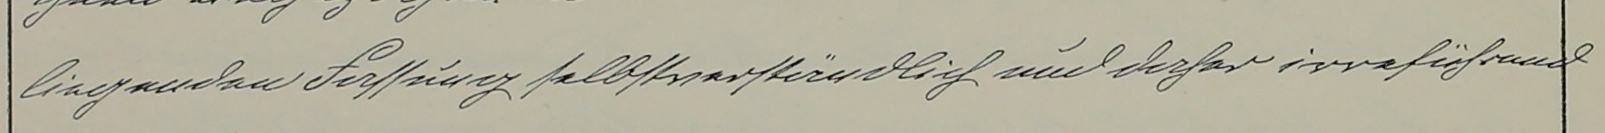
liegenden Fassung selbstverständlich und daher irreführend
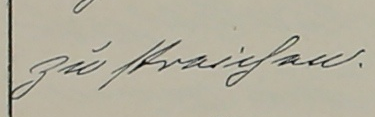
zu streichen.
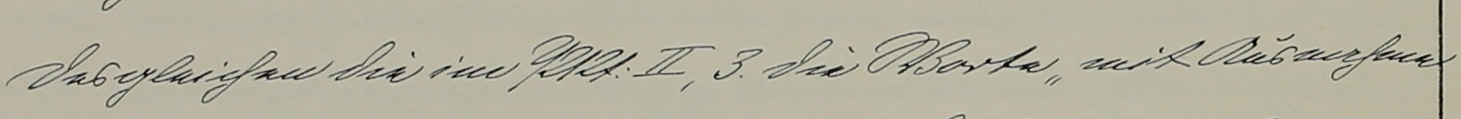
Desgleichen die Worte im Pkt. II,3. die Worte „mit Ausnahme
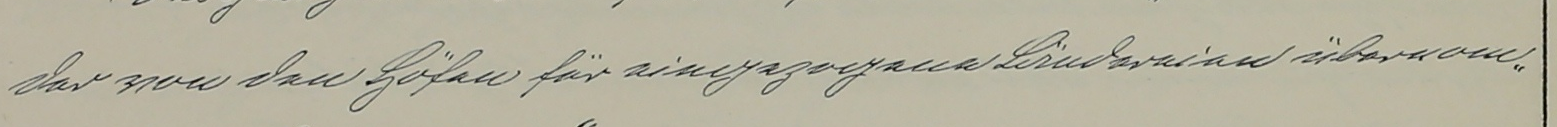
der von den Höfen für eingezogene Ländereien übernom-
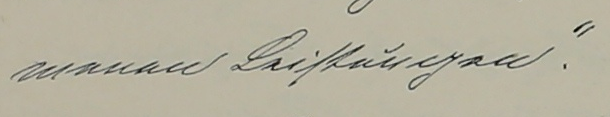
menen Leistungen“.
